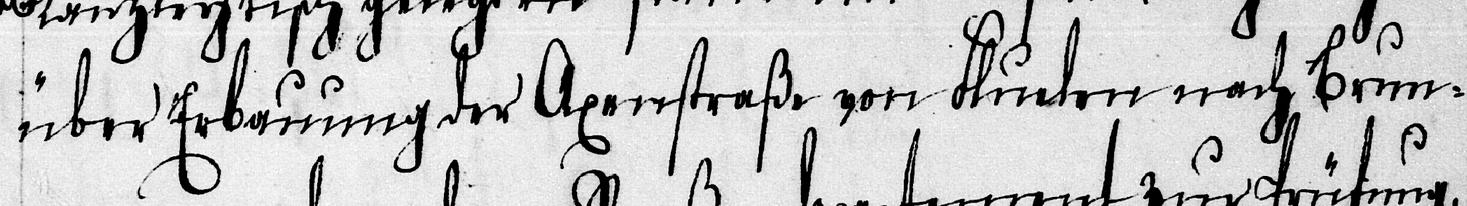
über Erbauung der Axenstraße von Fluelen nach Brun¬
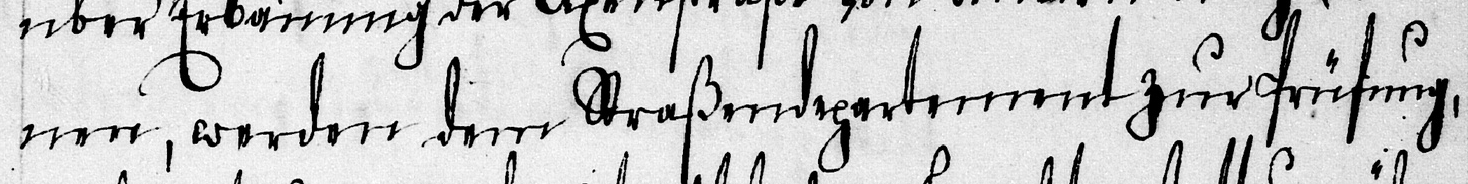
nen, werden dem Straßendepartement zur Prüfung,
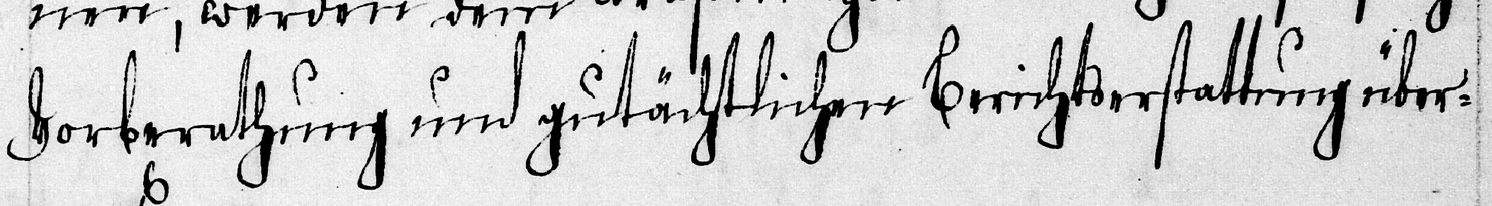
Vorberathung und gutächtlichen Berichtserstattung übe¬
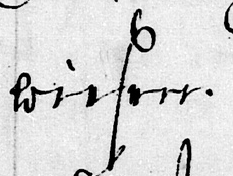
rwiesen.
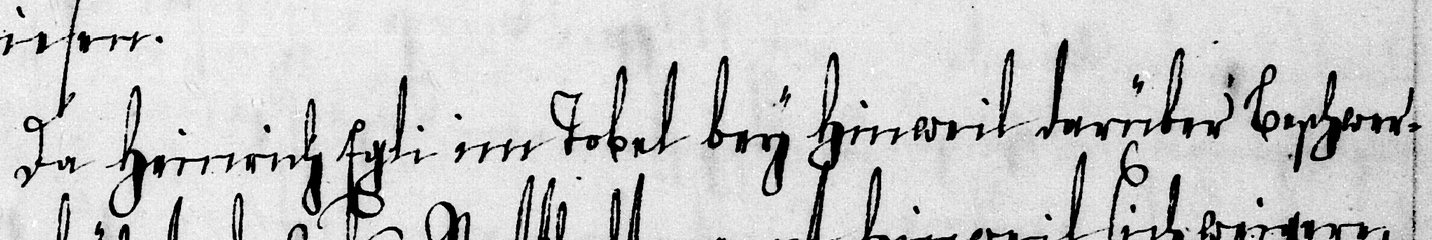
Da Heinrich Egli im Tobel bey Hinweil darüber Beschwer¬
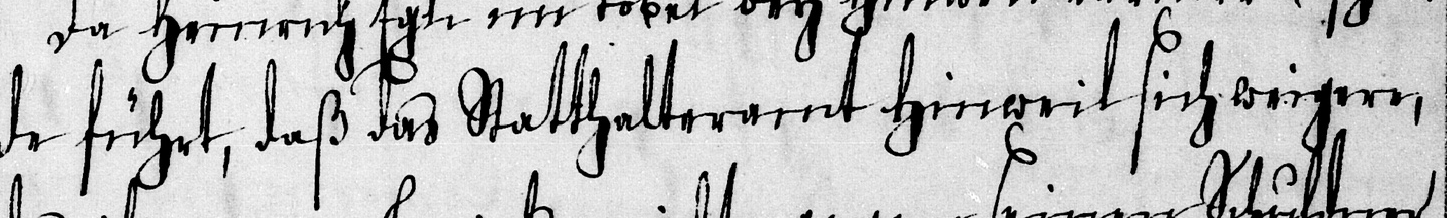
de führt, daß das Statthalteramt Hinweil sich weigere,
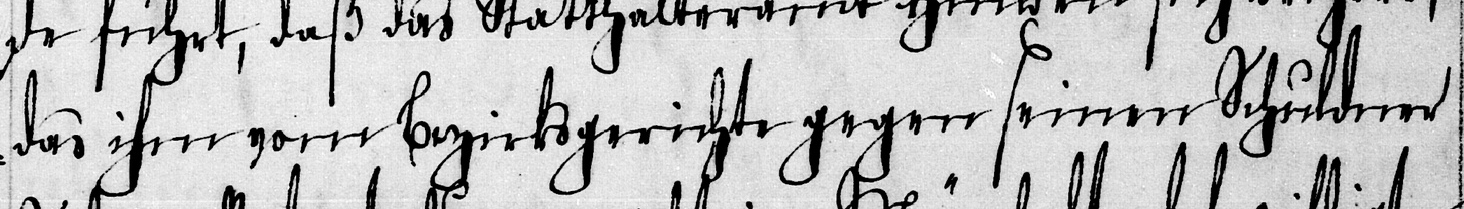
das ihm vom Bezirksgerichte gegen seinen Schuldner
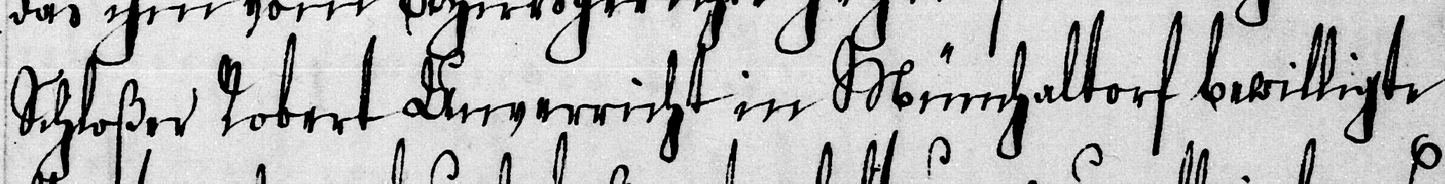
Schloßer Robert Unverricht in Münchaltorf bewilligte
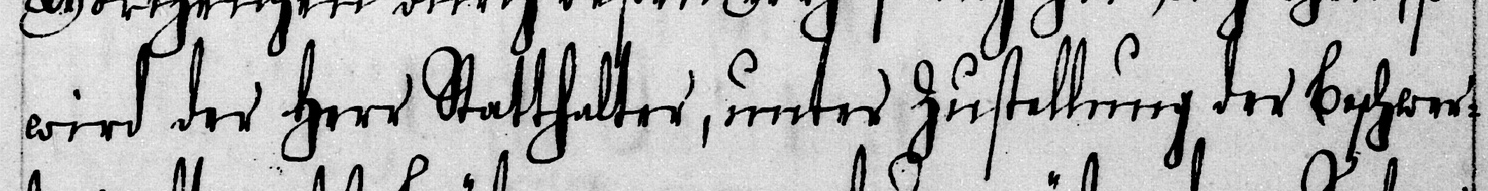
wird der Herr Statthalter, unter Zustellung der Beschwer¬
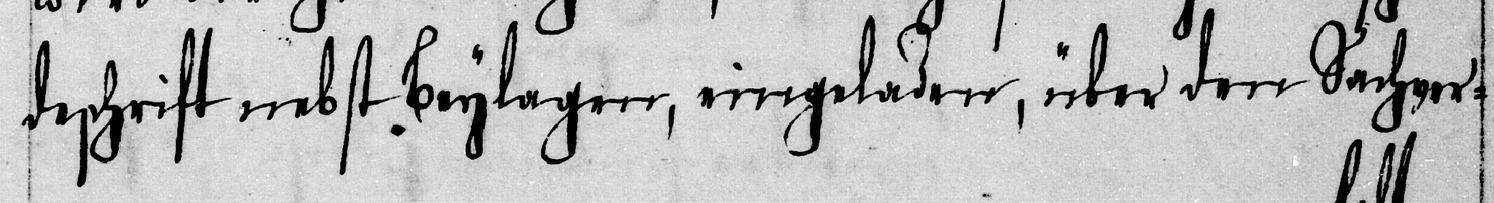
deschrift nebst Beylagen, eingeladen, über den Sachver-
